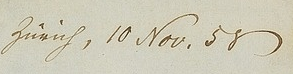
Zürich, 10 Nov. 58
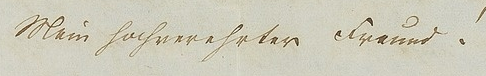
Mein hochverehrter Freund!
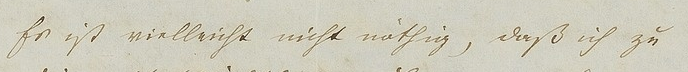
Es ist vielleicht nicht nöthig, daß ich zu
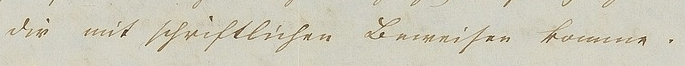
dir mit schriftlichen Beweisen komme.
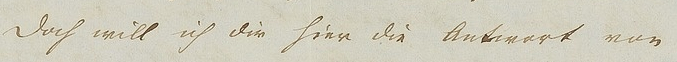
Doch will ich dir hier die Antwort von
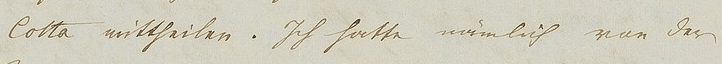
Cotta mittheilen. Ich hatte nämlich von der
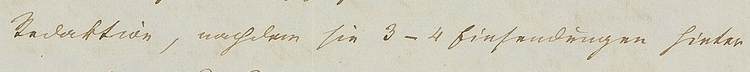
Redaktion, nachdem sie 3–4 Einsendungen hinter
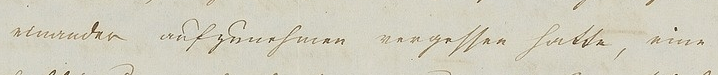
einander aufzunehmen vergessen hatte, eine
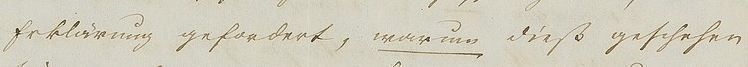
Erklärung gefordert, warum dieß geschehen
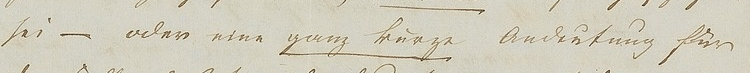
sei – oder eine ganz kurze Andeutung für
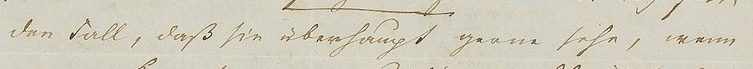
den Fall, daß sie überhaupt gram sehe, wenn
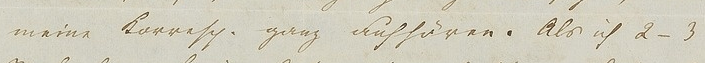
meine Korresp. ganz aufhören. Als ich 2–3
